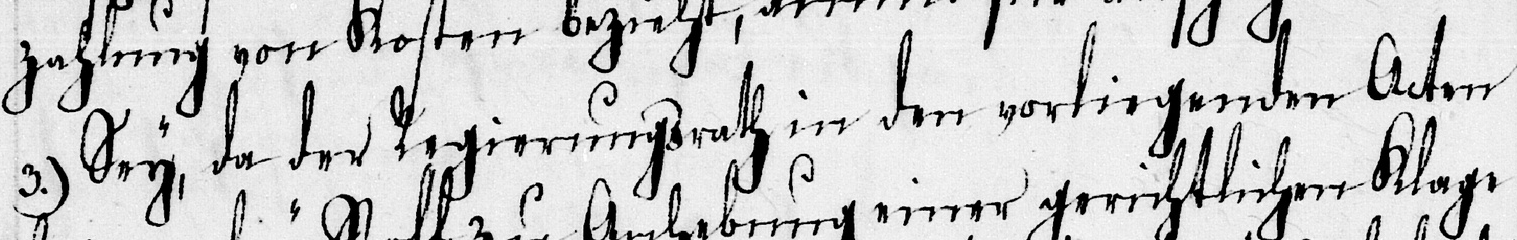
3.) Sey, da der Regierungsrath in den vorliegenden Acten
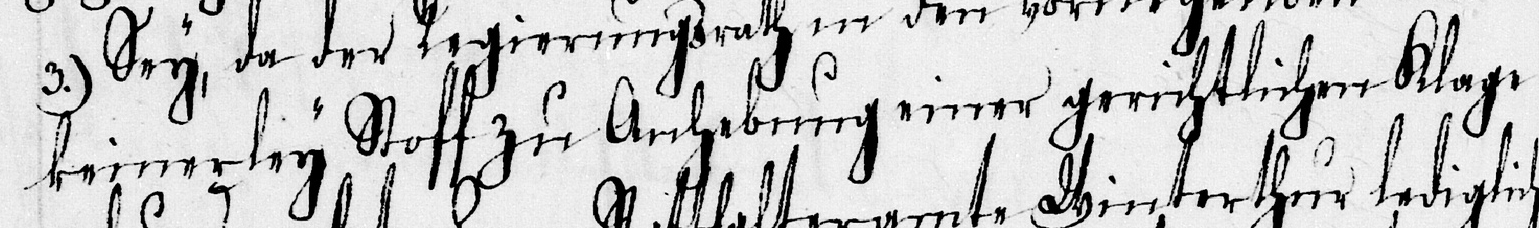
keinerley Stoff zu Anhebung einer gerichtlichen Klage
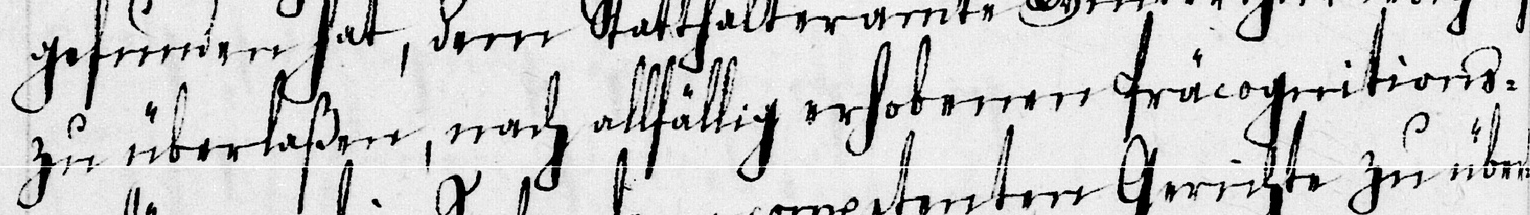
zu überlaßen, nach allfällig erhobenen Präcognitions¬
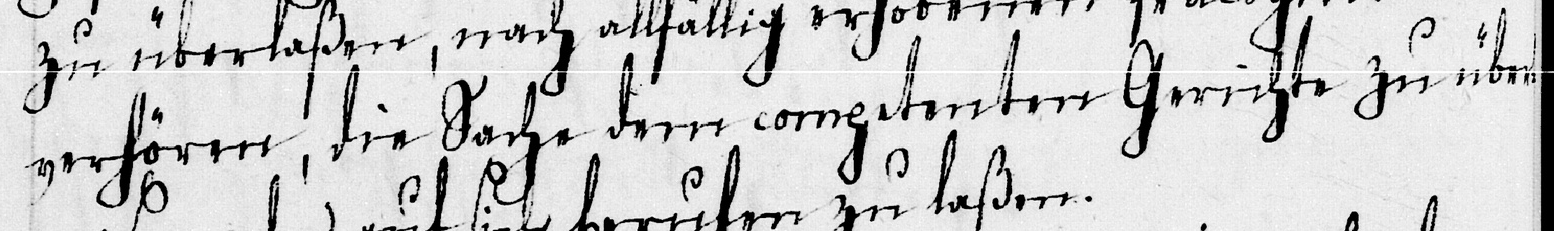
verhören, die Sache dem competenten Gerichte zu über¬
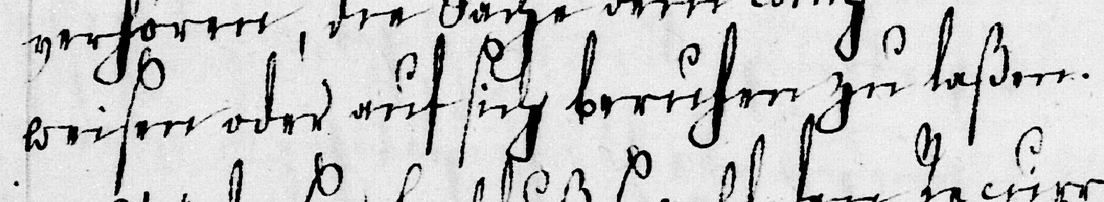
weisen oder auf sich beruhen zu laßen.
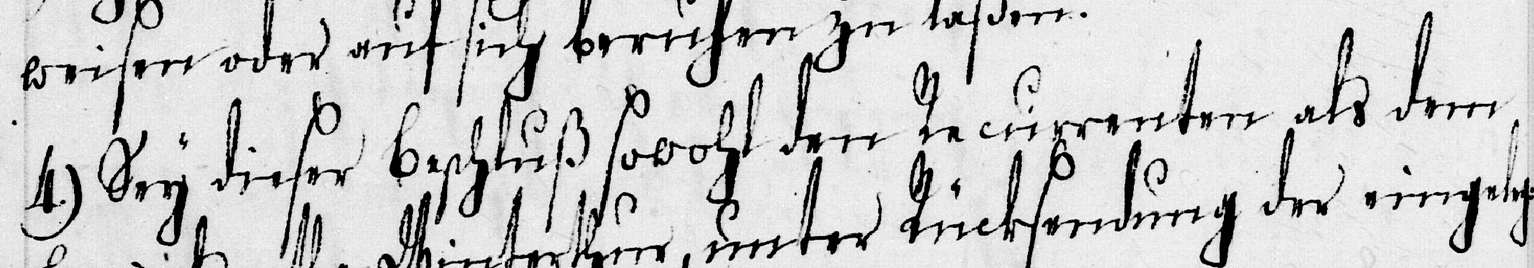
4.) Sey dieser Beschluß sowohl den Recurrenten als dem
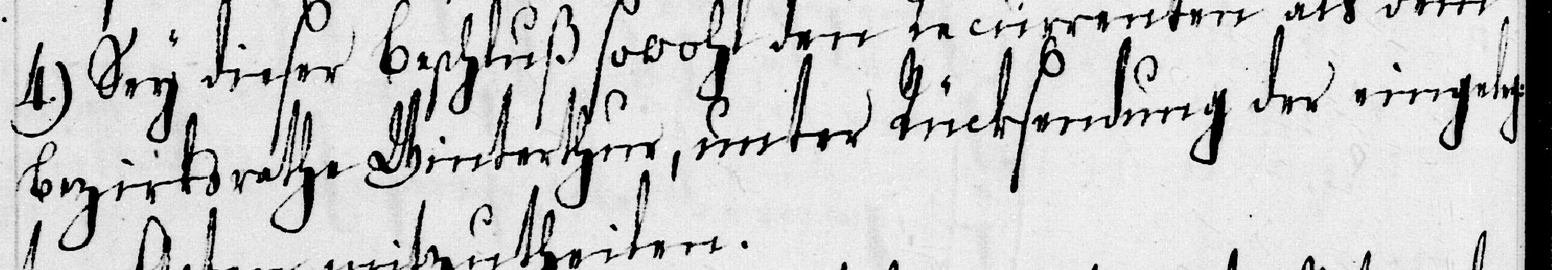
Bezirksrathe Winterthur, unter Rückforderung der eingele¬
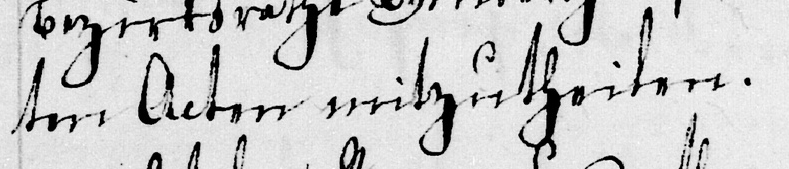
gten Acten mitzutheilen.
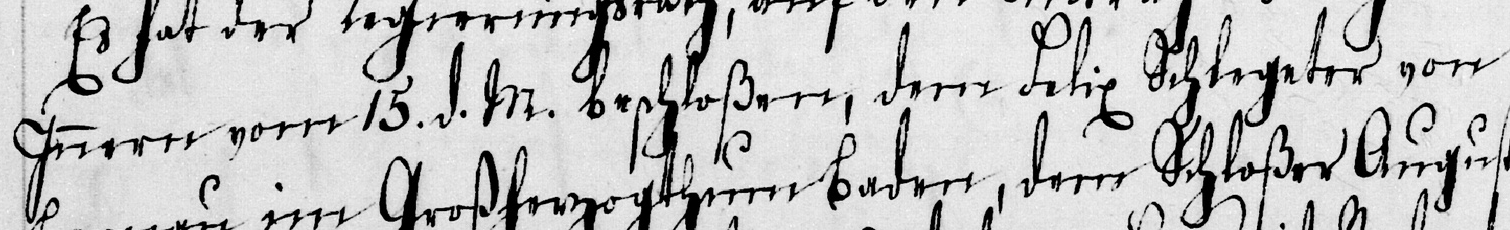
Innern vom 15. d. M. beschloßen, dem Felix Schlegeter von
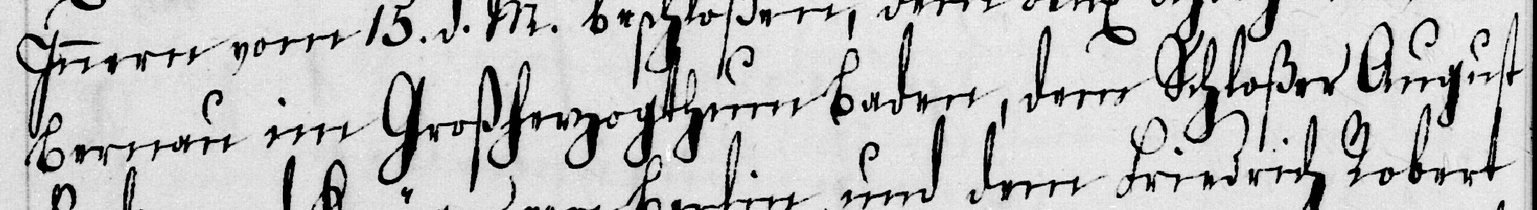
Bernau im Großherzogthum Baden, dem Schloßer August
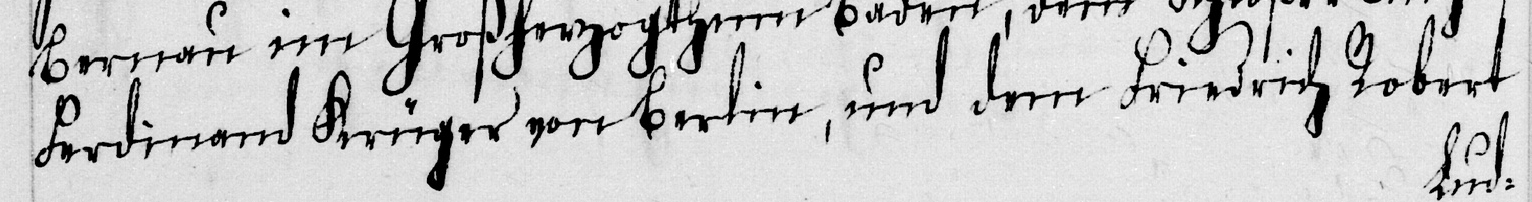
Ferdinand Krüger von Berlin, und dem Friedrich Robert
